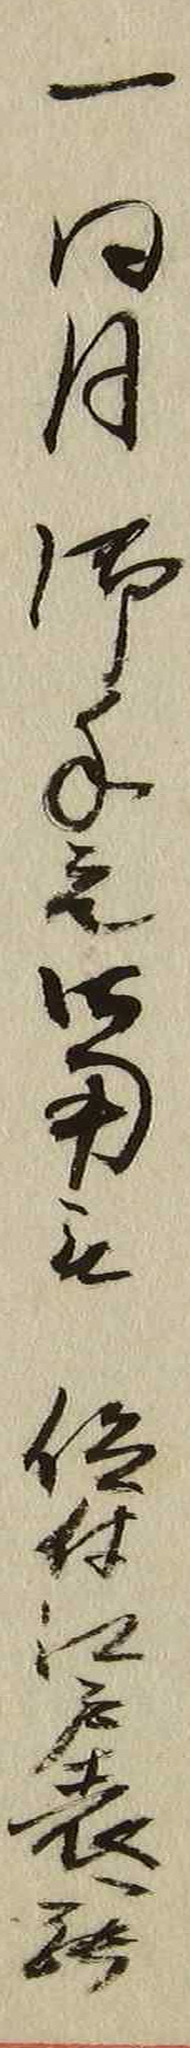一同月御手元御用被仰付江戸表へ罷
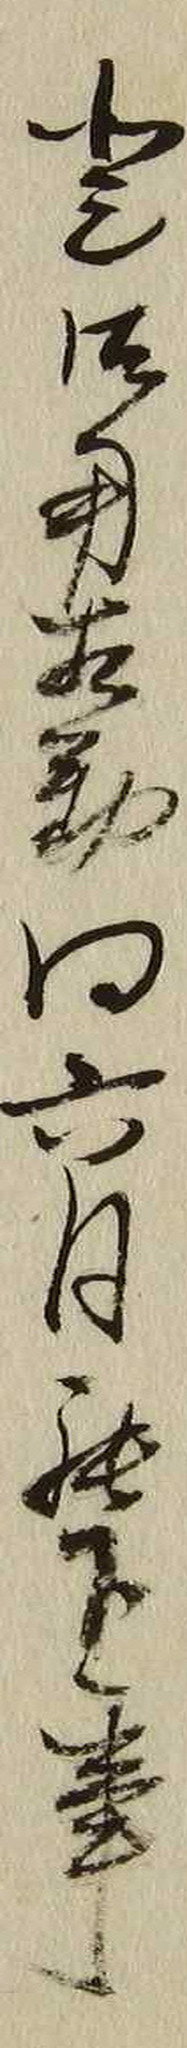登御用相勤同六月罷下候事
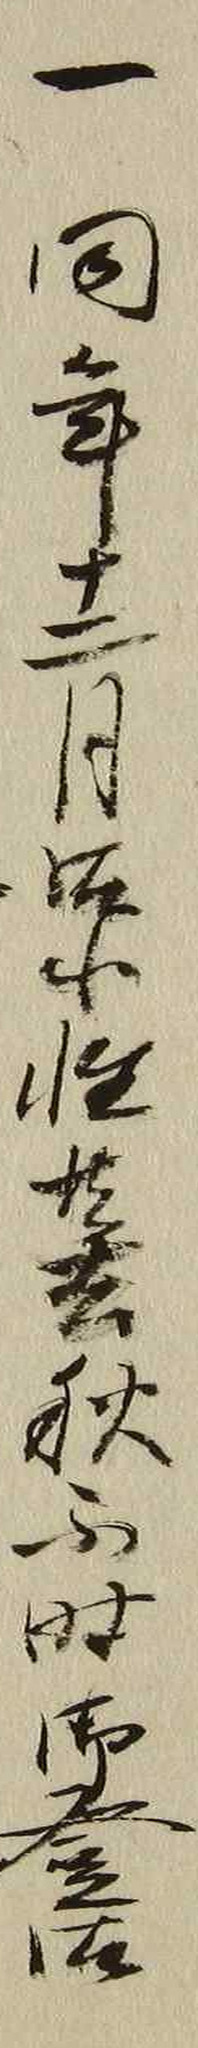一同年十二月御小性共去秋不時御登御
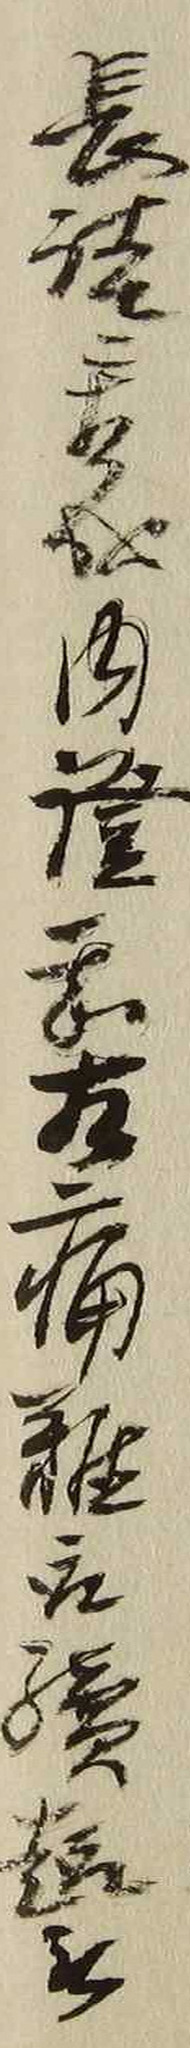長詰ニ相成内証甚相痛難被続趣被
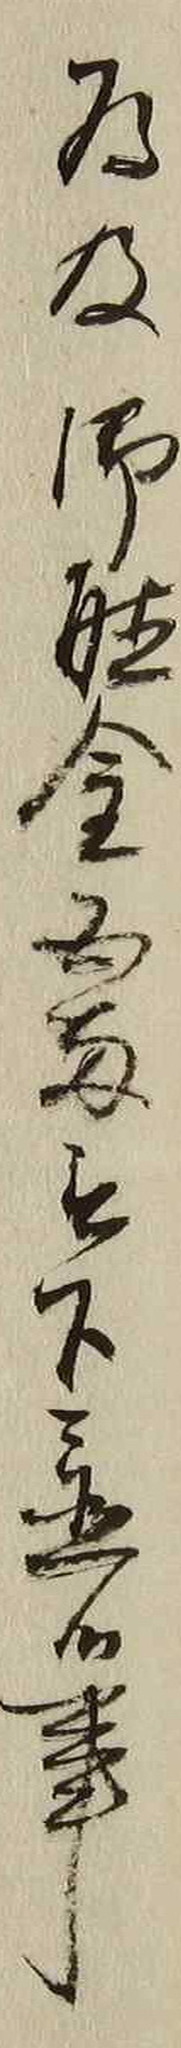為及御聴金五両被下置候事
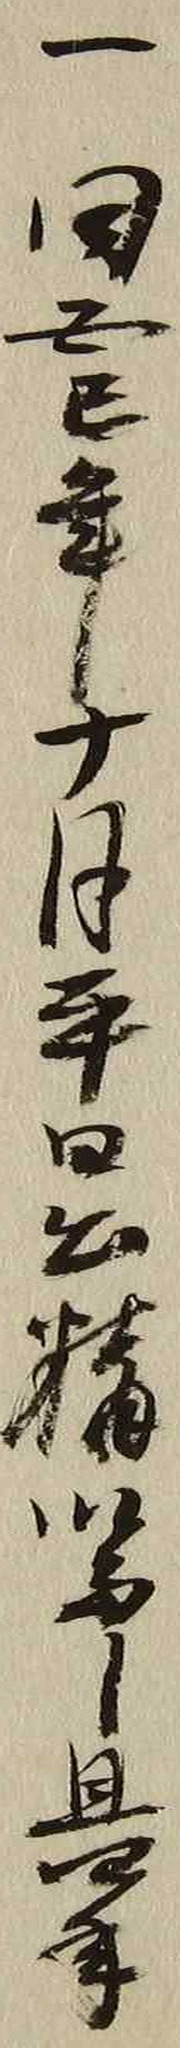一同五巳年十月平日出精いたし且四年
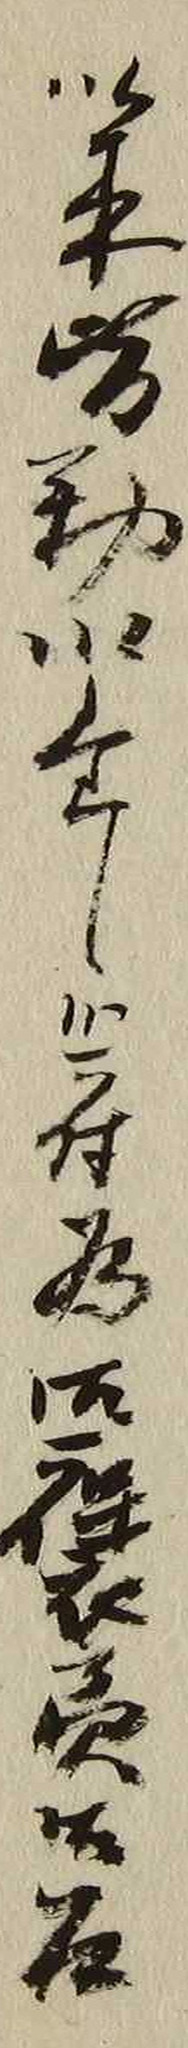以来皆勤いたし候ニ付為御褒美御召
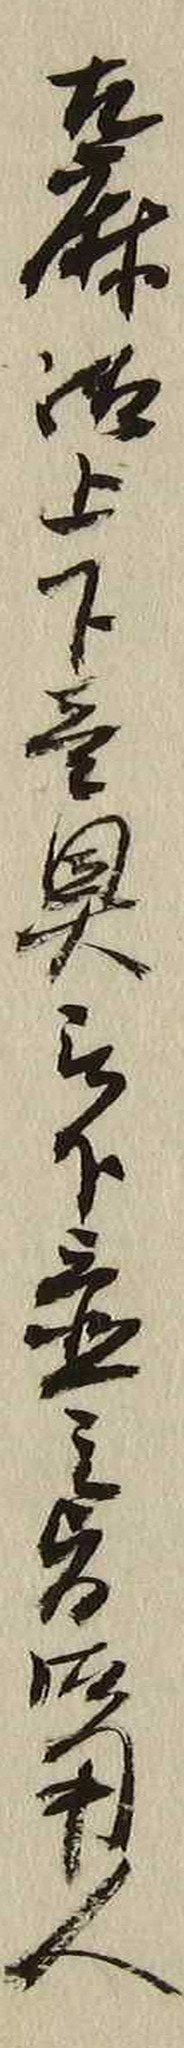古麻御上下壱具被下置之旨御用人
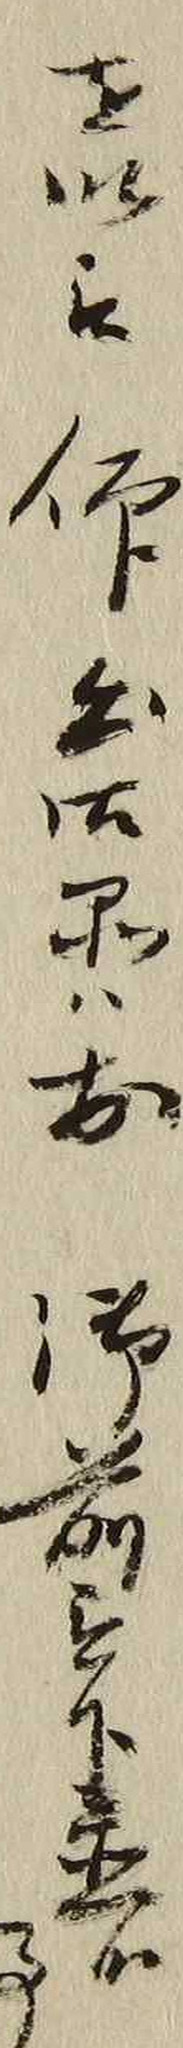を以被仰出御品ハ於御前被下置候事
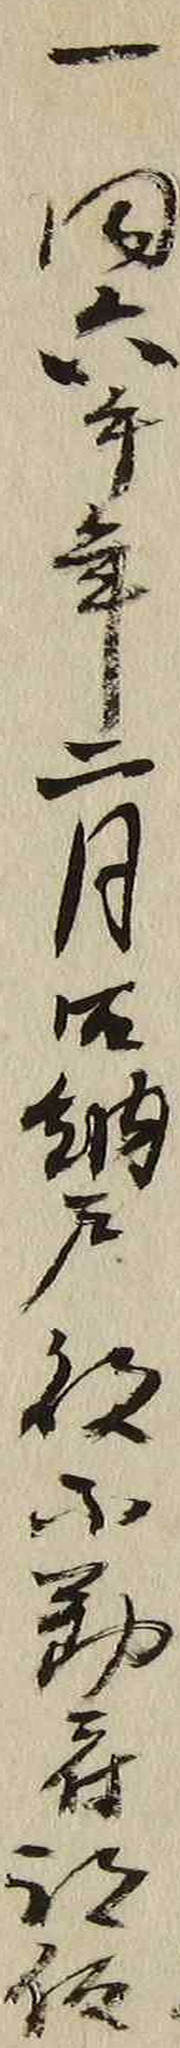一同六午年二月御納戸役不勤ニ付跡仮
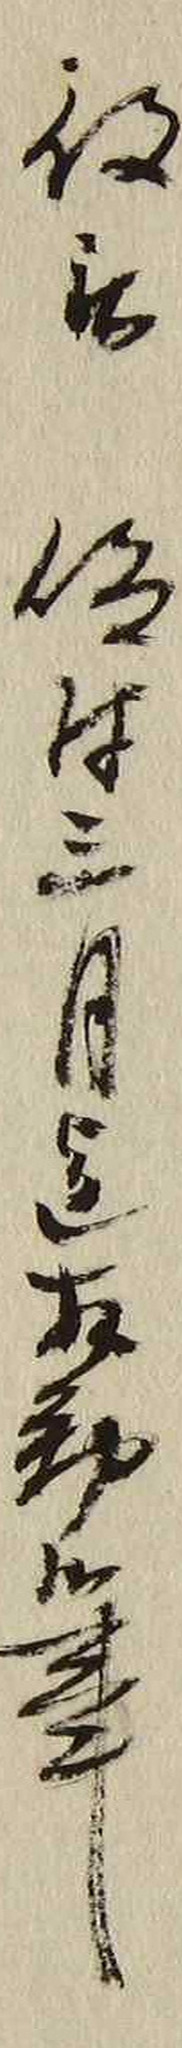役被仰付三月迄相勤候事
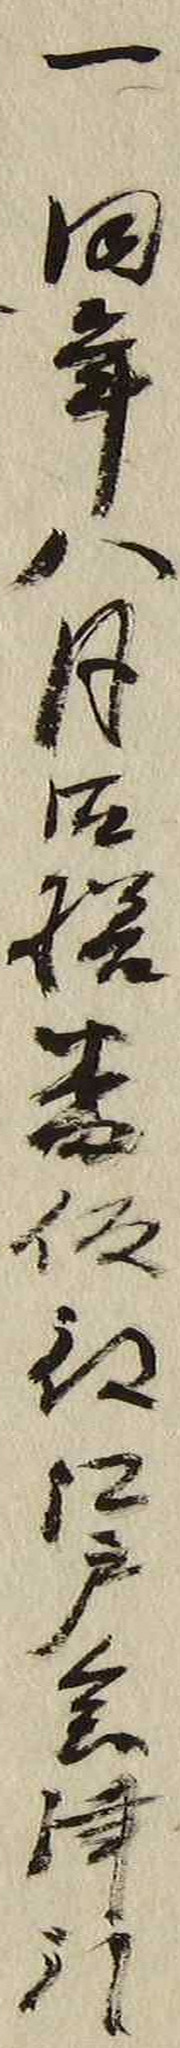一同年八月御膳番仮役江戸会津引
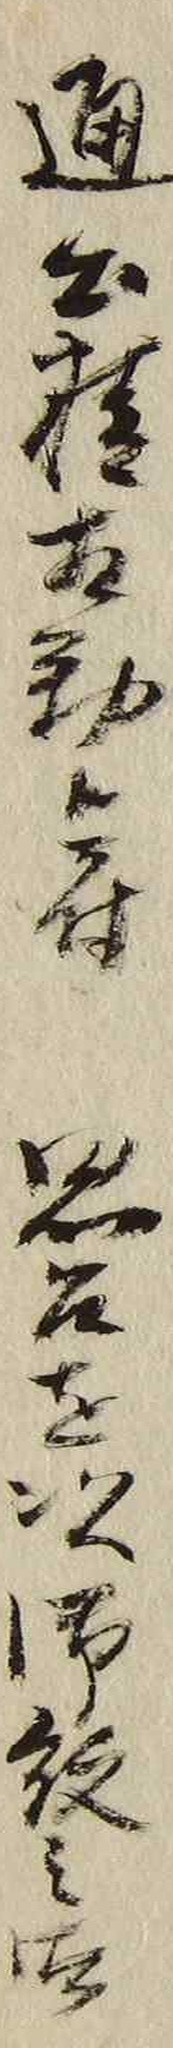通出精相勤候ニ付思召を以御紋之御
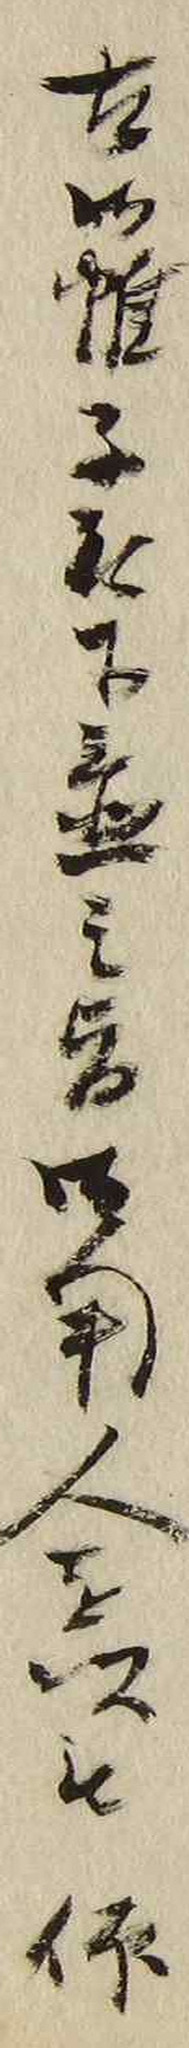古御帷子被下置之旨御用人を以被仰

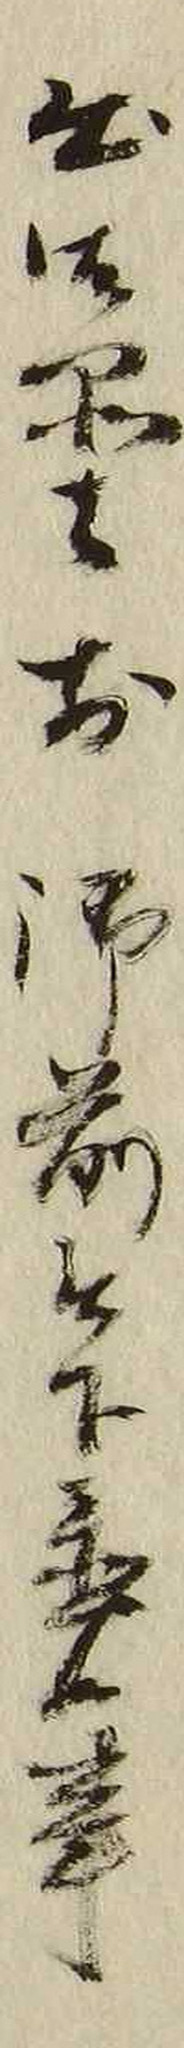出御品々於御前被下置候事
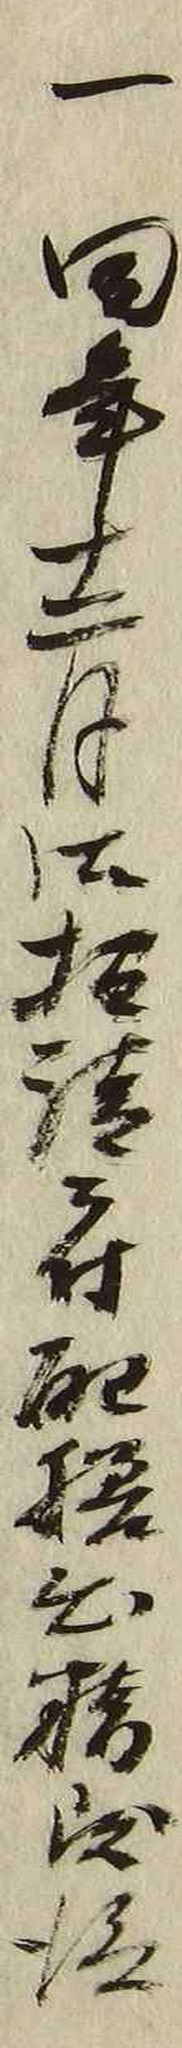一同年十二月御招請ニ付配膳出精致後
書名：諸士系譜　巻之345　も之部1
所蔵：会津若松市立会津図書館
